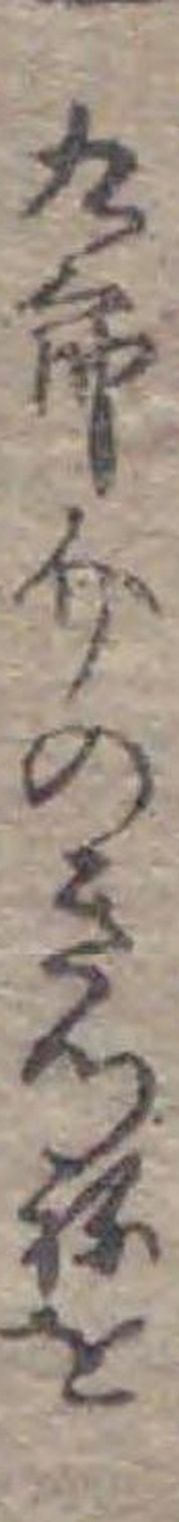九郎介のきつねを
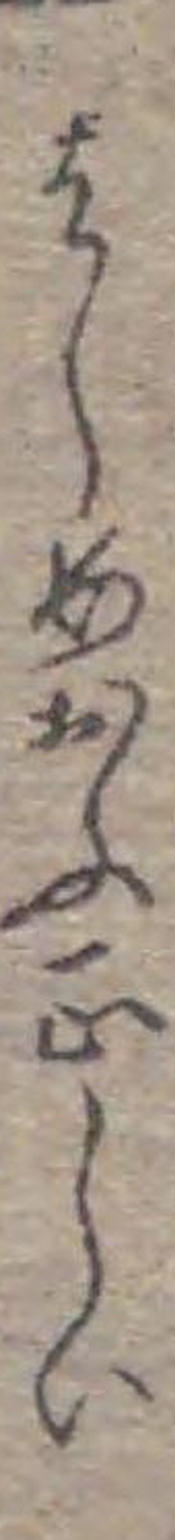はしめおふ正しい
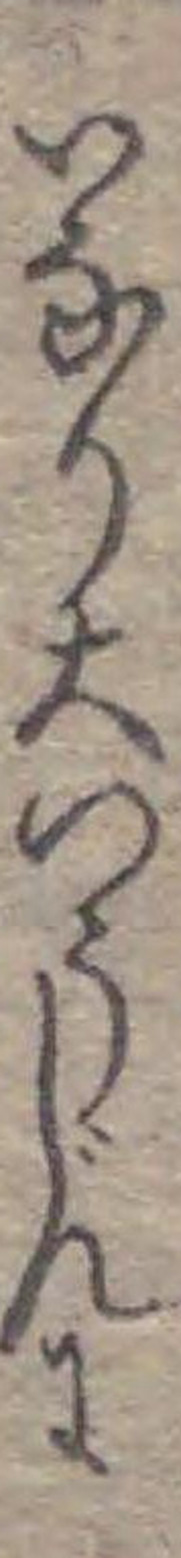いなり大つうじんに
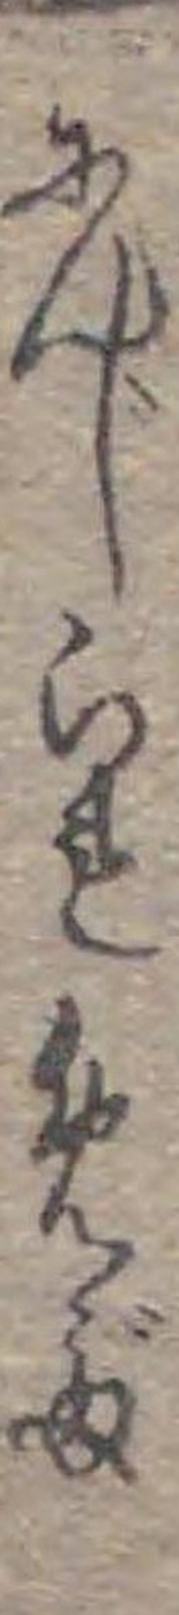にんじられめだ
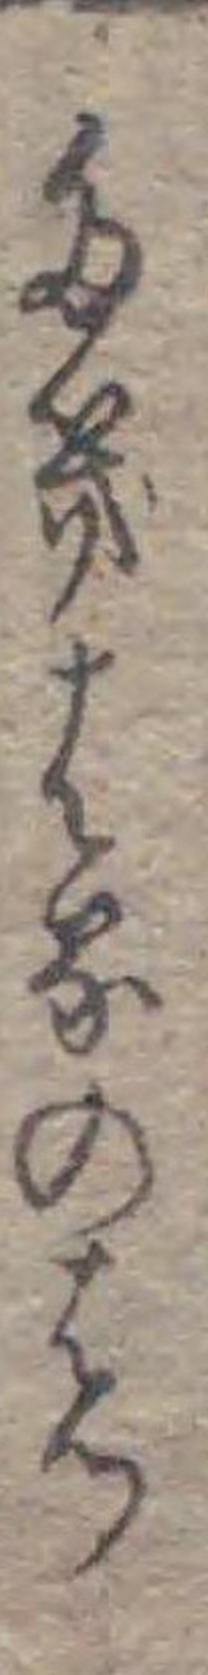たきはるのはつ
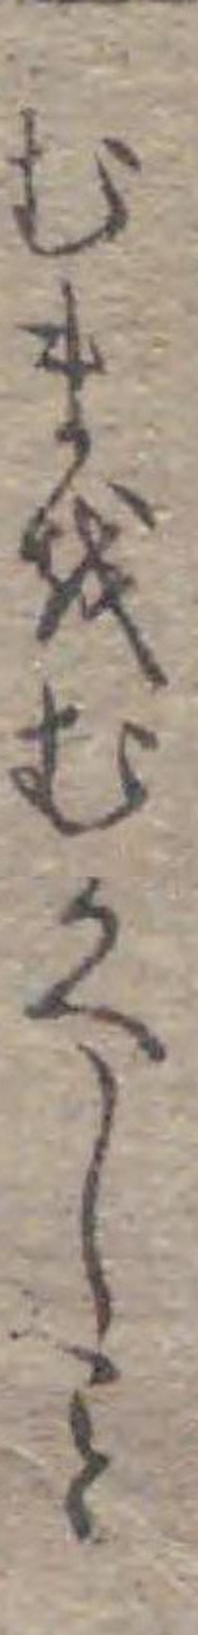むまをむかへしこと
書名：紺屋百物語 : 3巻
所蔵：国立国会図書館 National Diet Library, JAPAN
